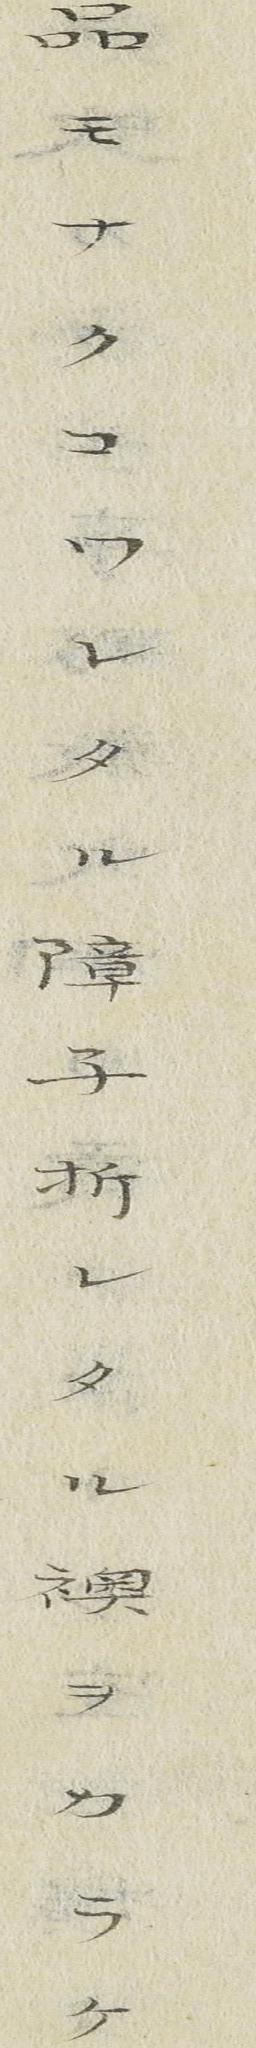品モナクコワレタル障子折レタル襖ヲカラケ
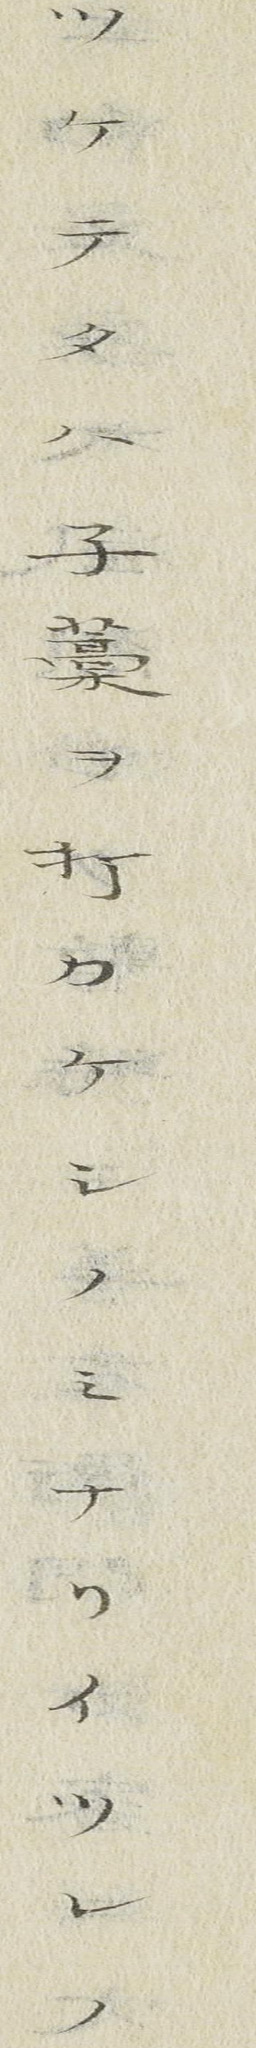ツケテタハ子藁ヲ打カケシノミナリイツレノ
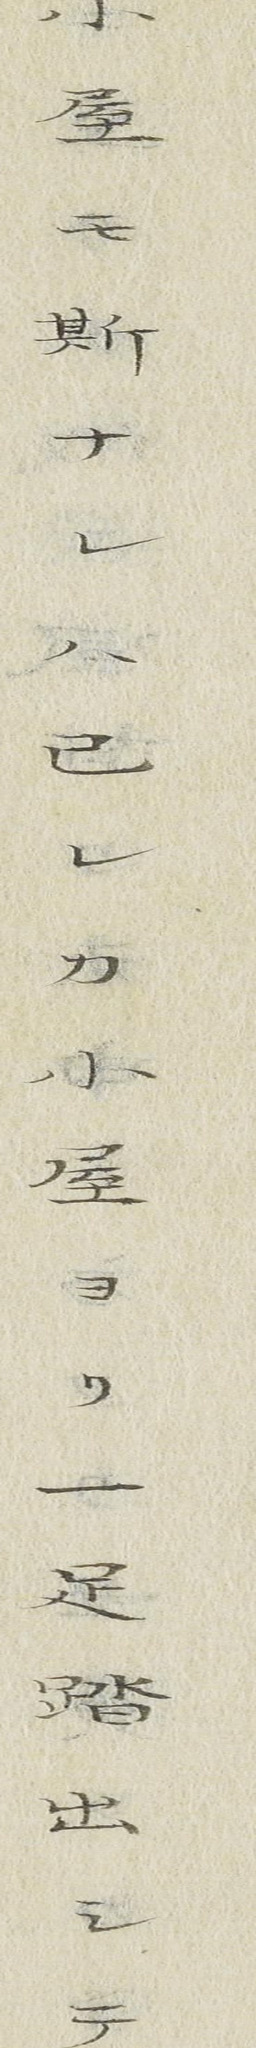小屋モ斯ナレハ己レカ小屋ヨリ一足踏出シテ
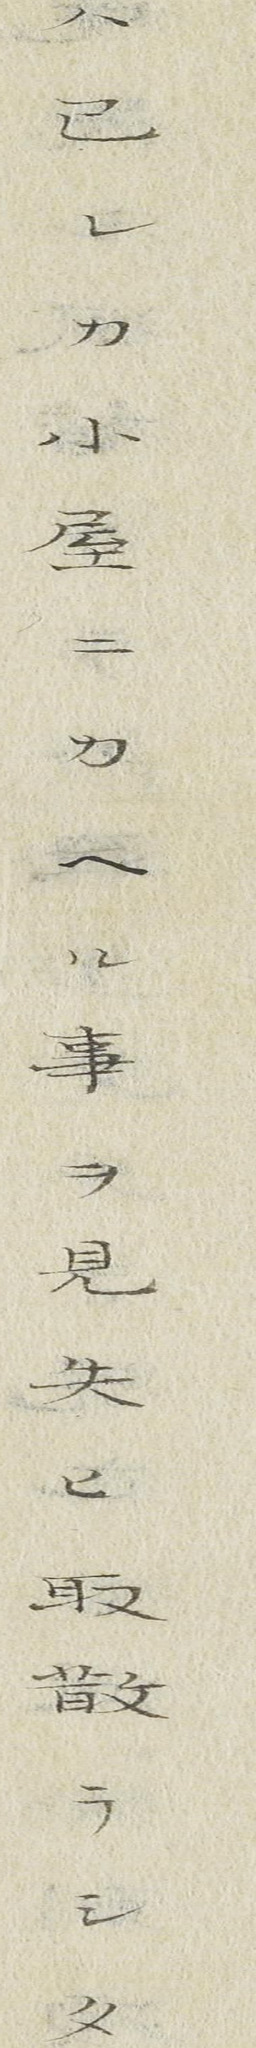ハ己レカ小屋ニカヘル事ヲ見失ヒ取散ラシタ
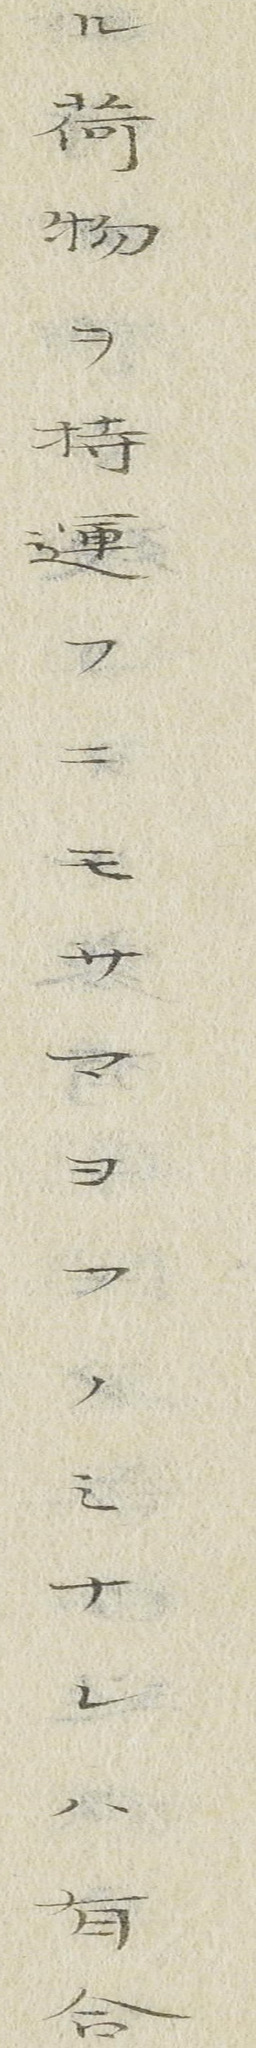ル荷物ヲ持運フニモサマヨフノミナレハ有合
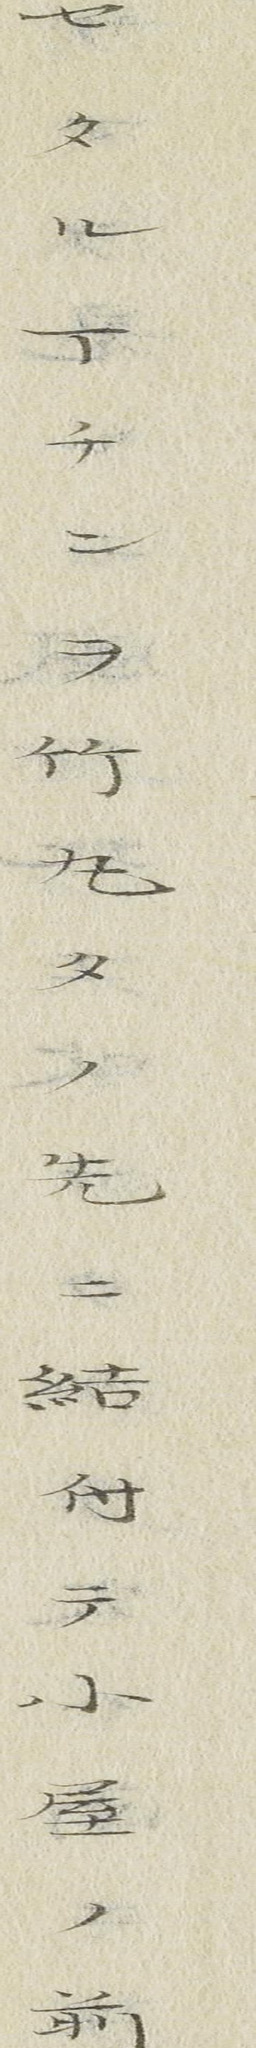セタル丁チンヲ竹丸タノ先ニ結付テ小屋ノ前
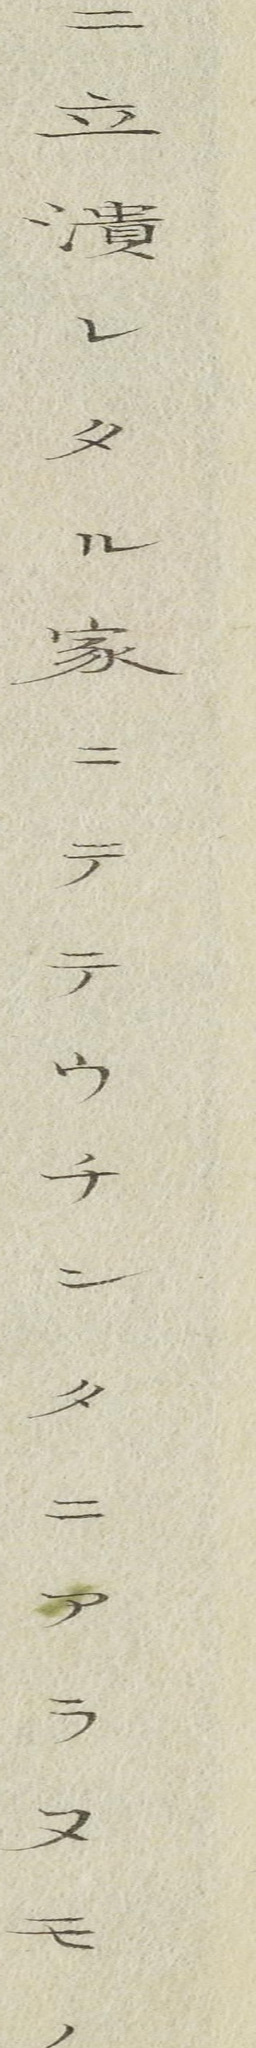ニ立潰レタル家ニテテウチンタニアラヌモノ
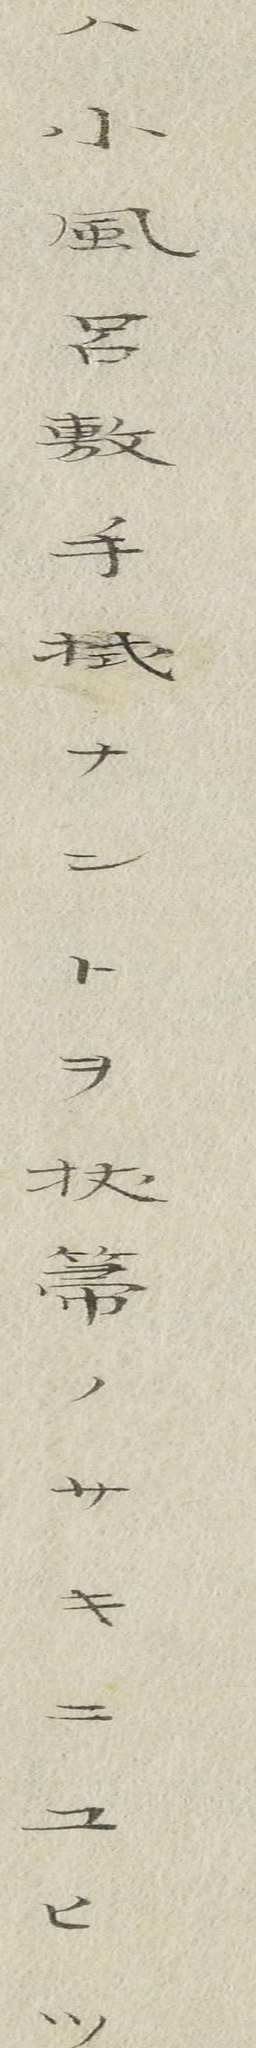ハ小風呂敷手拭ナントヲ杖箒ノサキニユヒツ
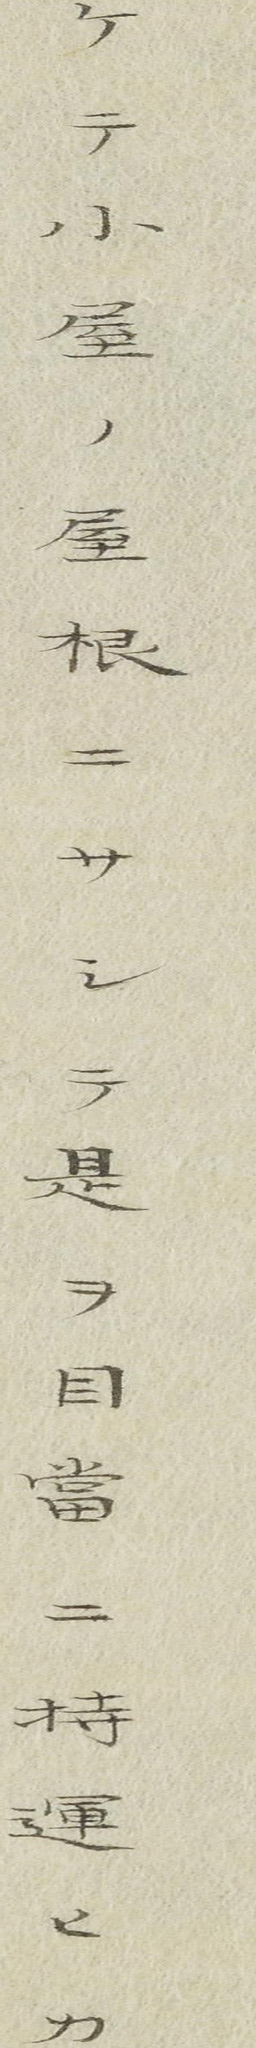ケテ小屋ノ屋根ニサシテ是ヲ目当ニ持運ヒカ
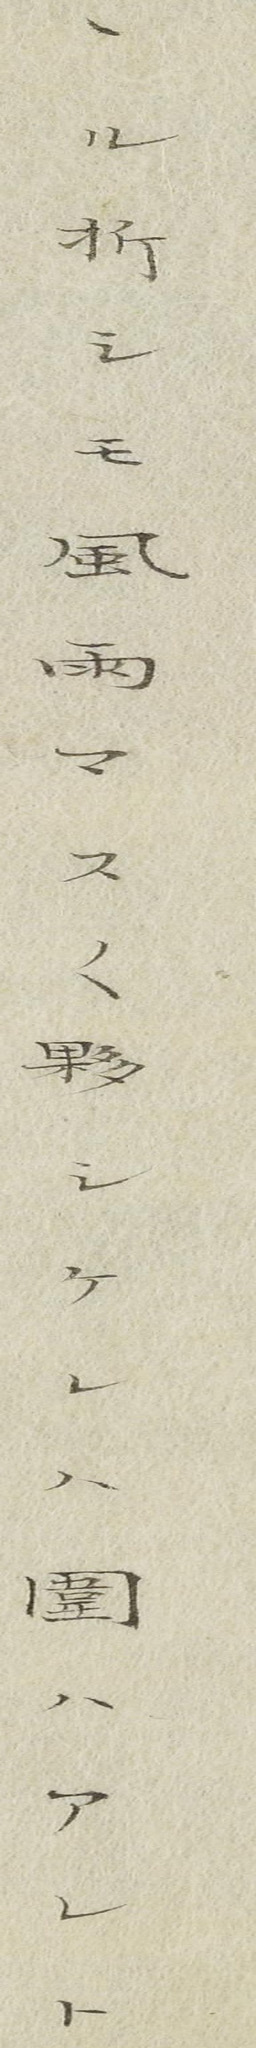ヽル折シモ風雨マス〱夥シケレハ囲ハアレト
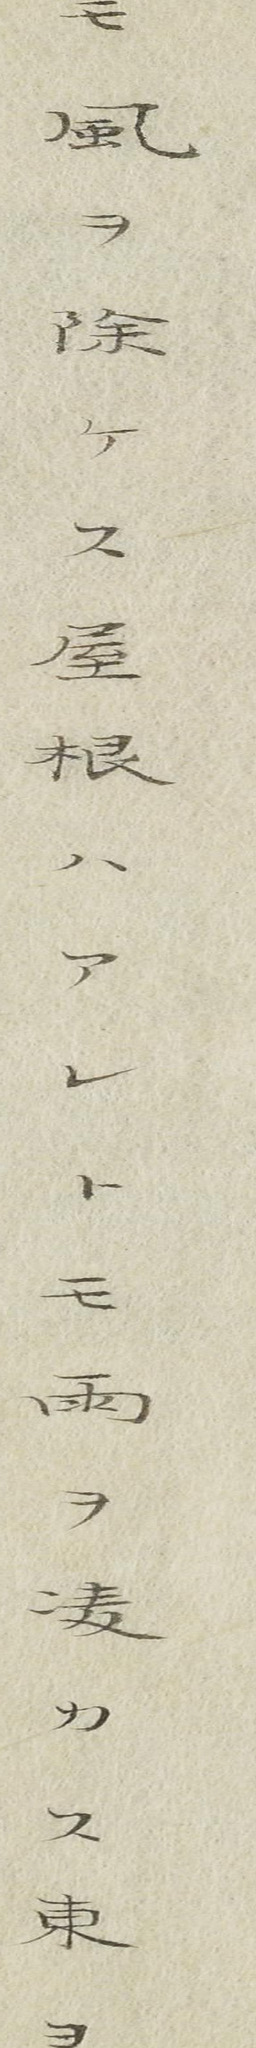モ風ヲ除ケス屋根ハアレトモ雨ヲ凌カス東ヨ
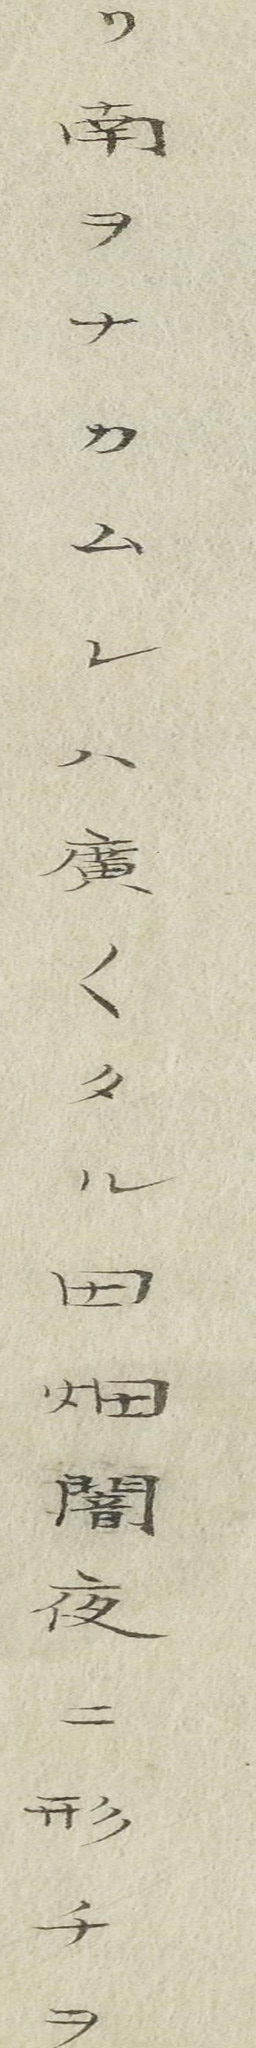リ南ヲナカムレハ広〱タル田畑暗夜ニ形チヲ
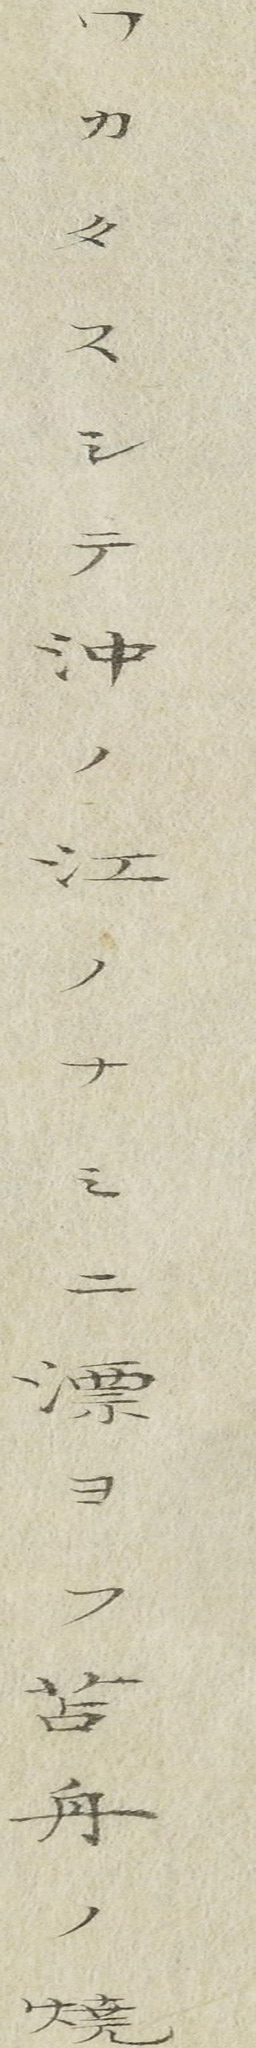ワカタスシテ沖ノ江ノナミニ漂ヨフ苫舟ノ焼
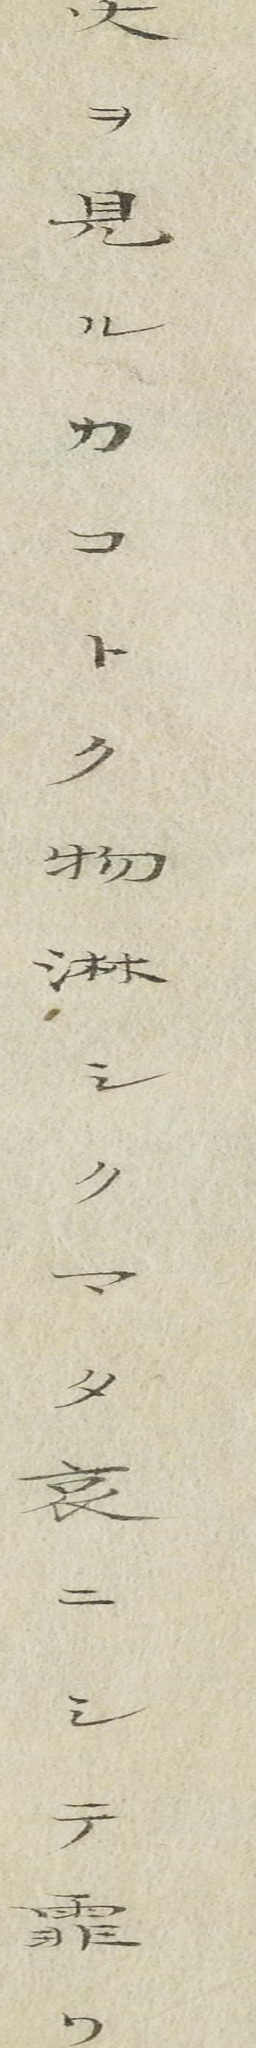火ヲ見ルカコトク物淋シクマタ哀ニシテ霏リ
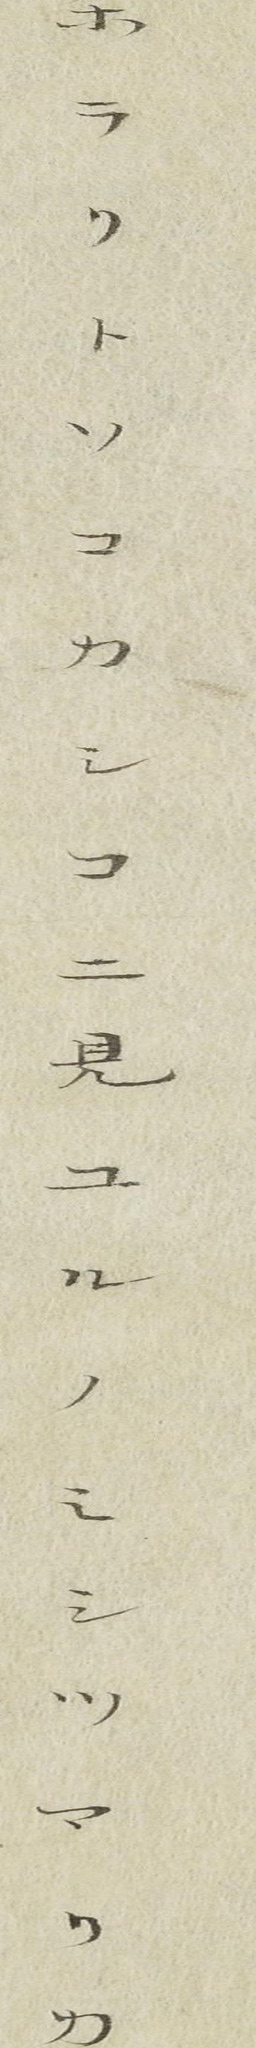ホラリトソコカシコニ見ユルノミシツマリカ
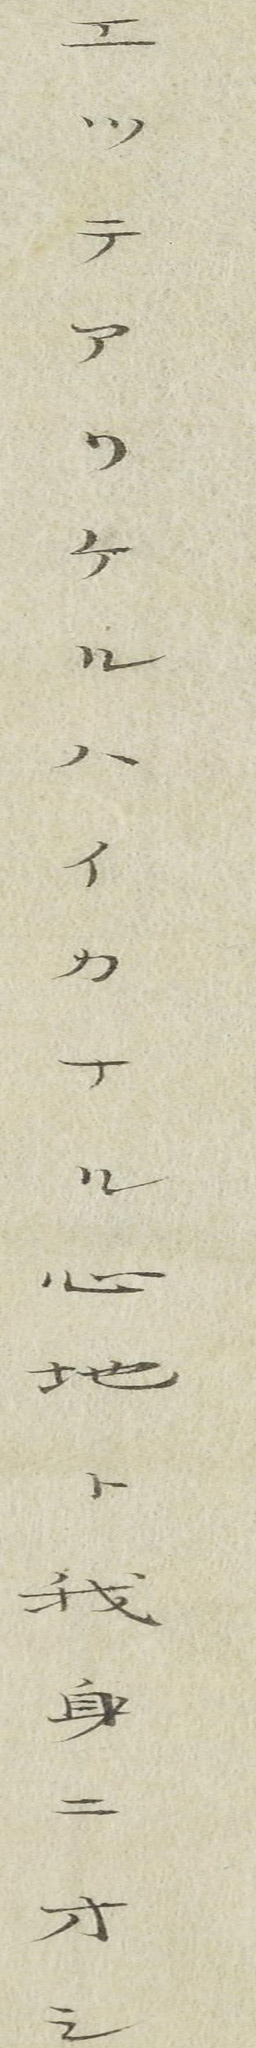エツテアリケルハイカナル心地ト我身ニオシ
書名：地災撮要　地震之部　巻ノ二
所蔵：東京大学地震研究所図書室 Earthquake Research Institute Library, The University of Tokyo, JAPAN
